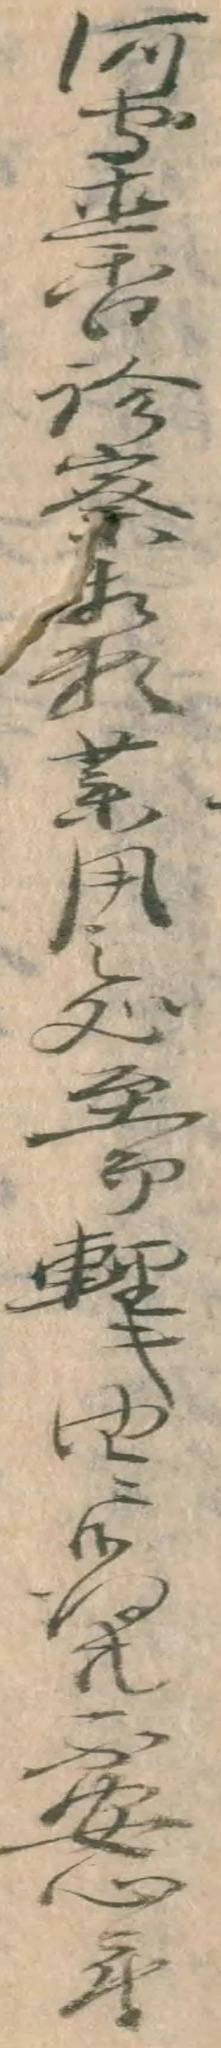河守直曾察相頼薬用之処至而軽キ由ニ候得共不安心ニ付
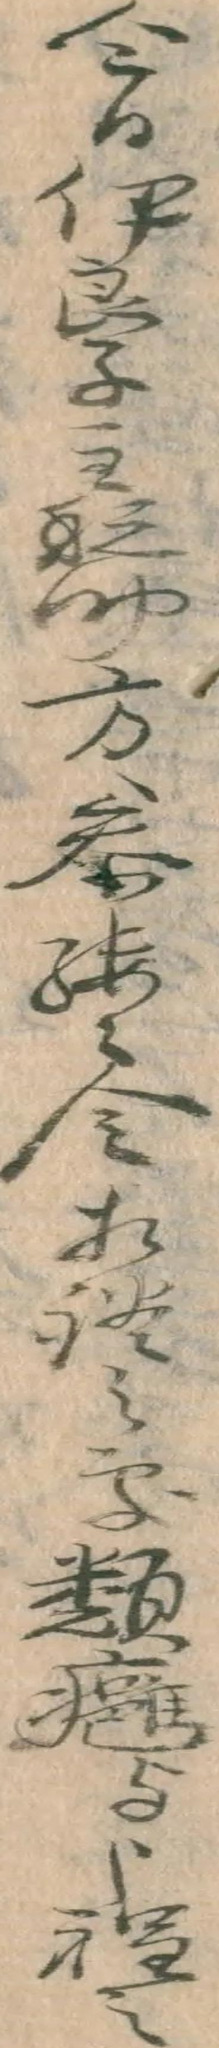今日伊良子主税助方へ参残之令相談之處類癰と申程之
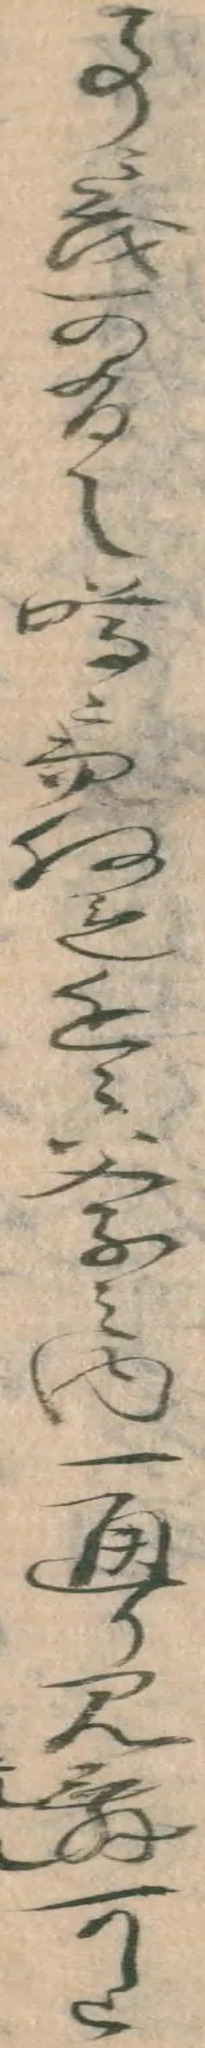事ニも可有之噂ニ而何れ近〻父子之内一通り見舞可被
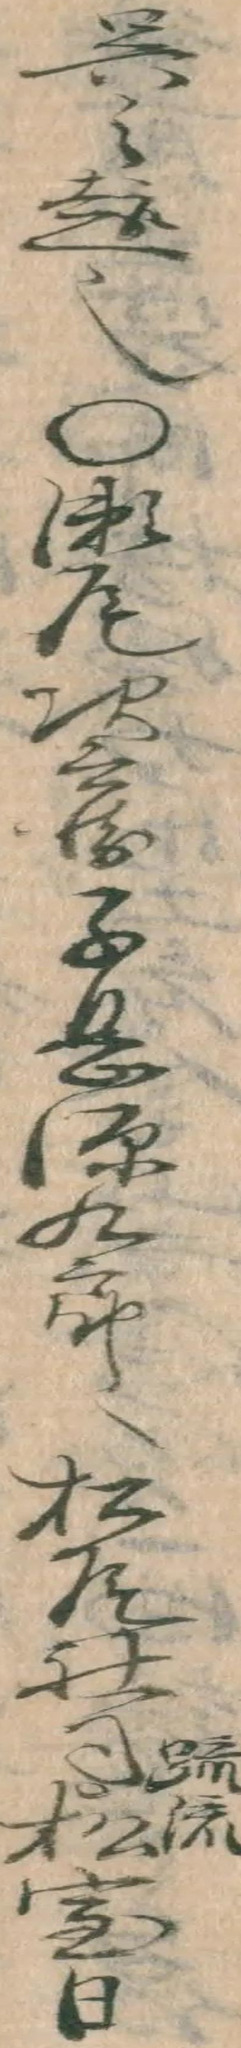呉之趣也○瀬尾次郎子息源九郎へ松尾社司䟽流松室日
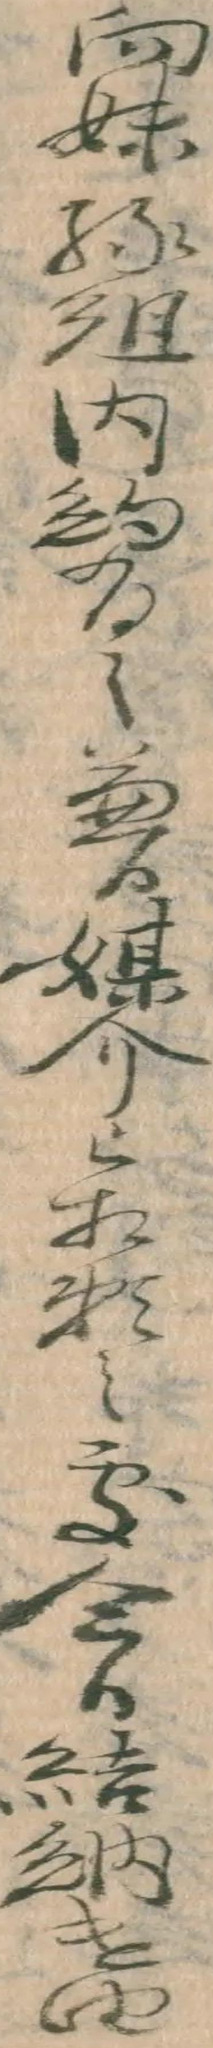向妹縁組内約有之兼候媒介被相頼之處今日結納遣由
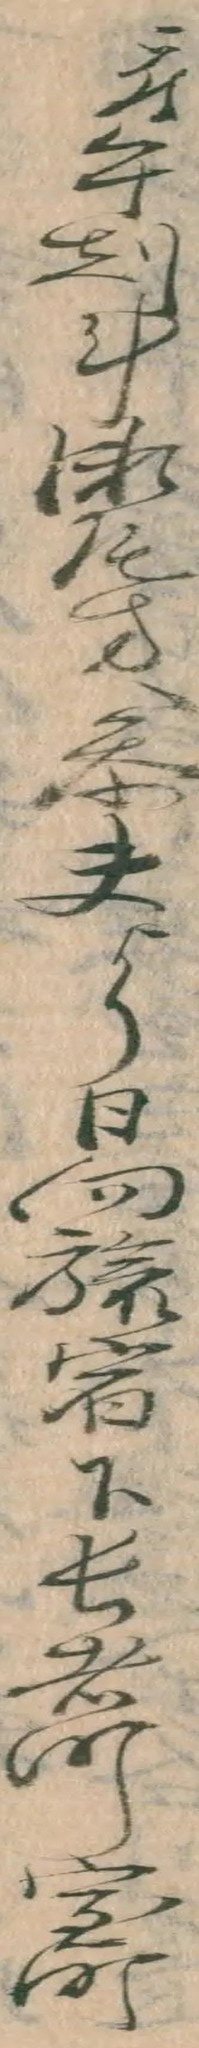ニ付午刻斗瀬尾方へ参夫より日向旅宿下長者町室町
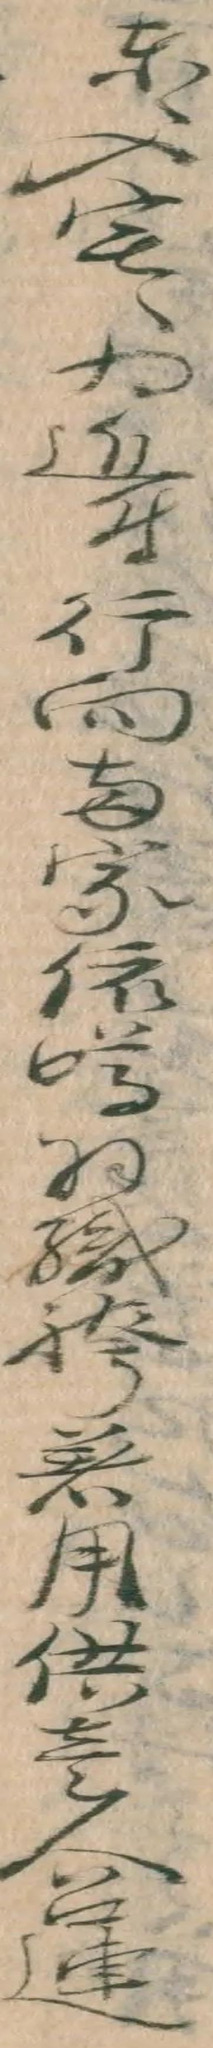東へ入宅へ為近付行向両家依噂羽織袴着用供壱人召連
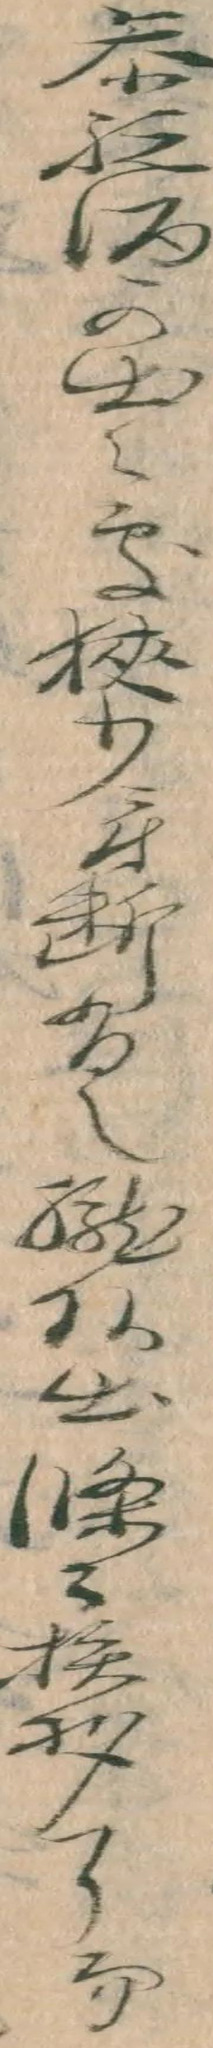参祝酒可出之處狭少に付断有之蹴頭出條々挨拶了而
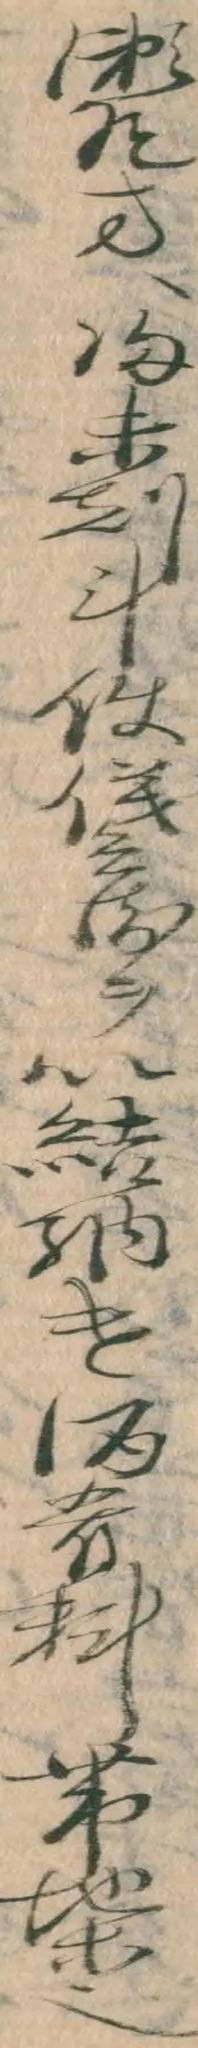瀬尾方へ帰未刻斗使儀兵衛ヲ以結納遣酒肴料帯地等也
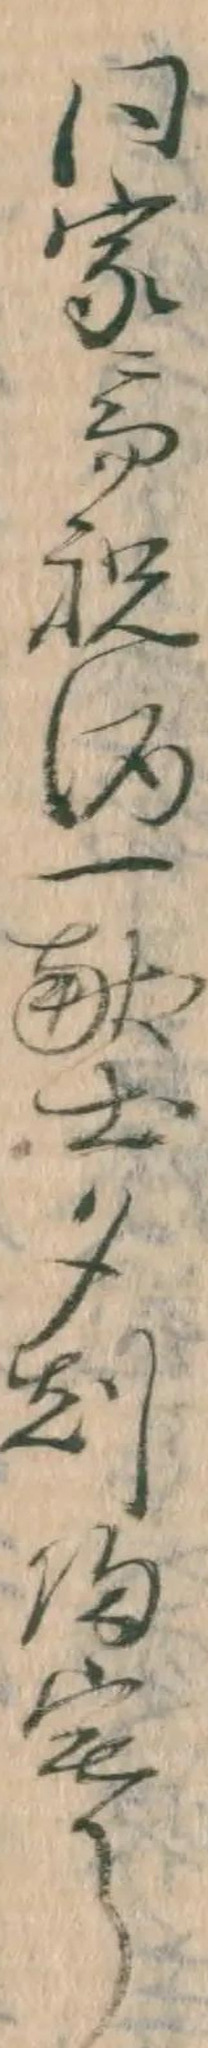同家ニ而祝酒一献士夕刻帰宅了
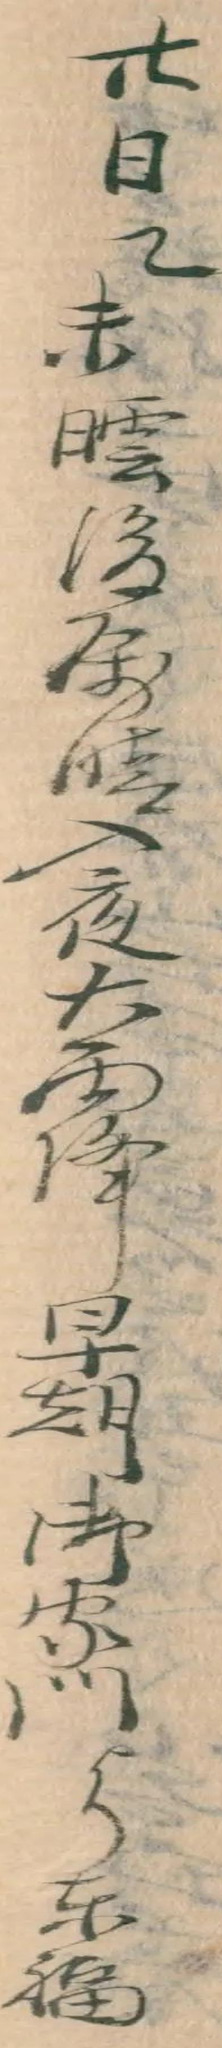廿日乙未曇後属晴入夜大雨降早朝御家門より東福
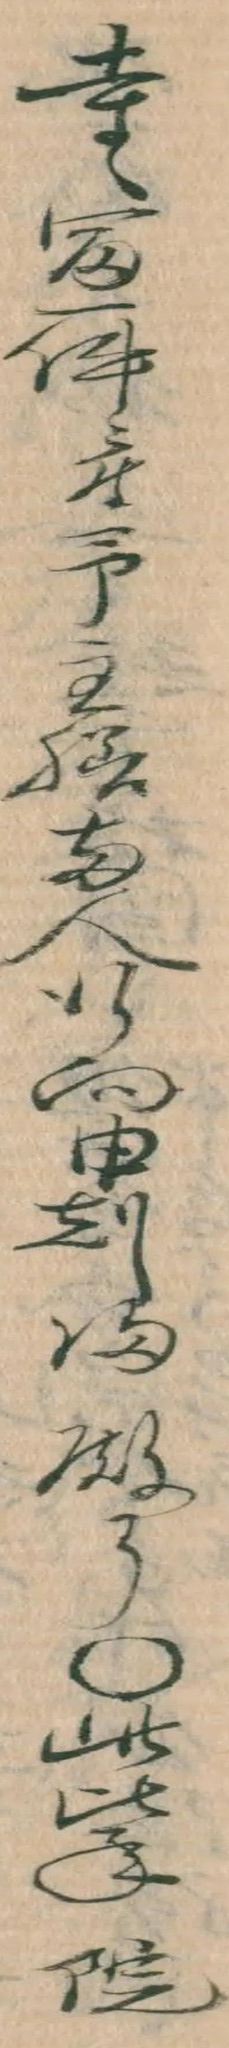寺へ富一件ニ付予主膳両人行向申刻帰殿了〇此年院
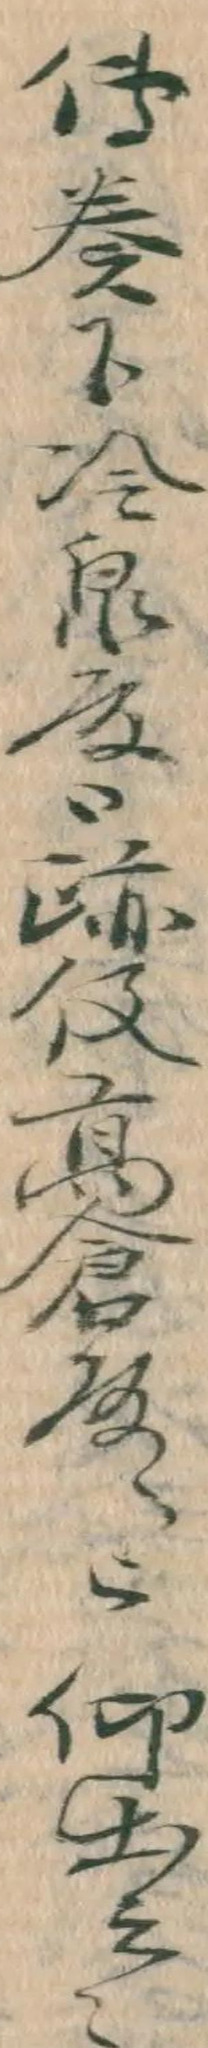傳奏下冷泉殿御跡役高倉殿へ被仰出云々
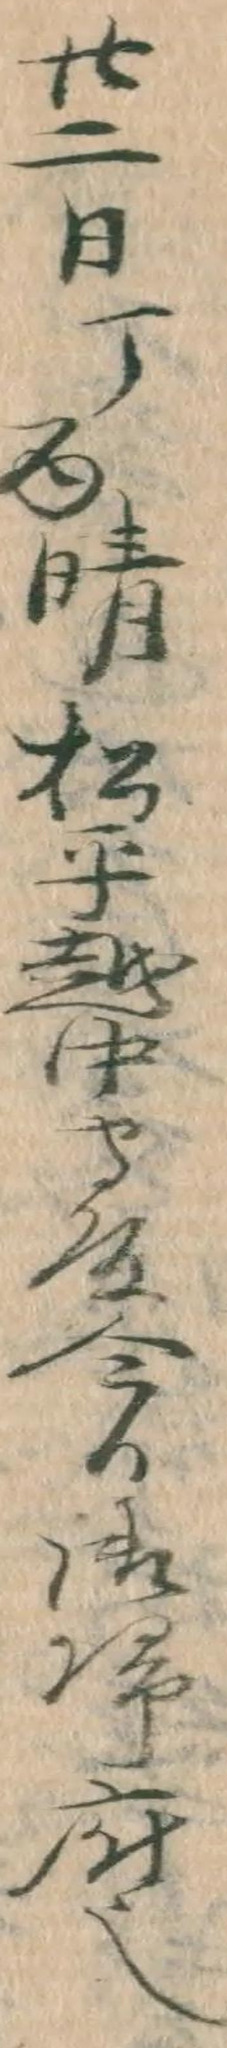廿二日丁酉晴松平越中守殿今日御帰府也
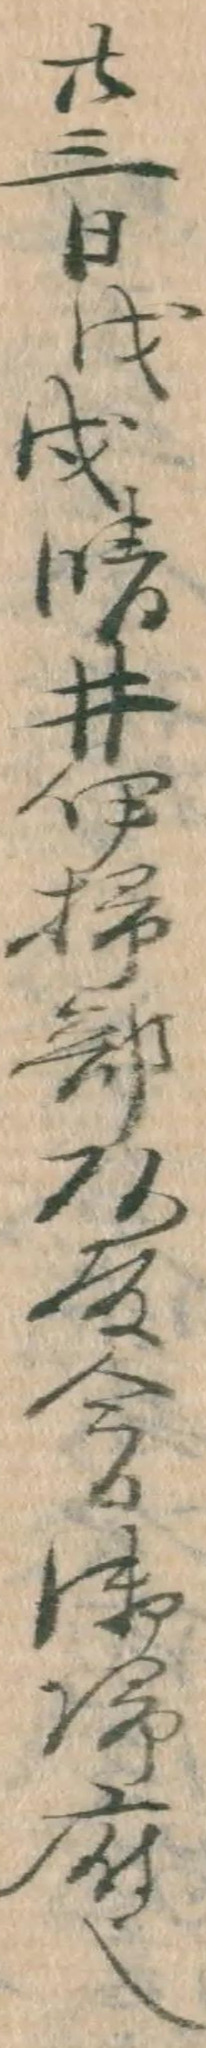廿三日戊戌晴井伊掃部頭殿今日御帰府之
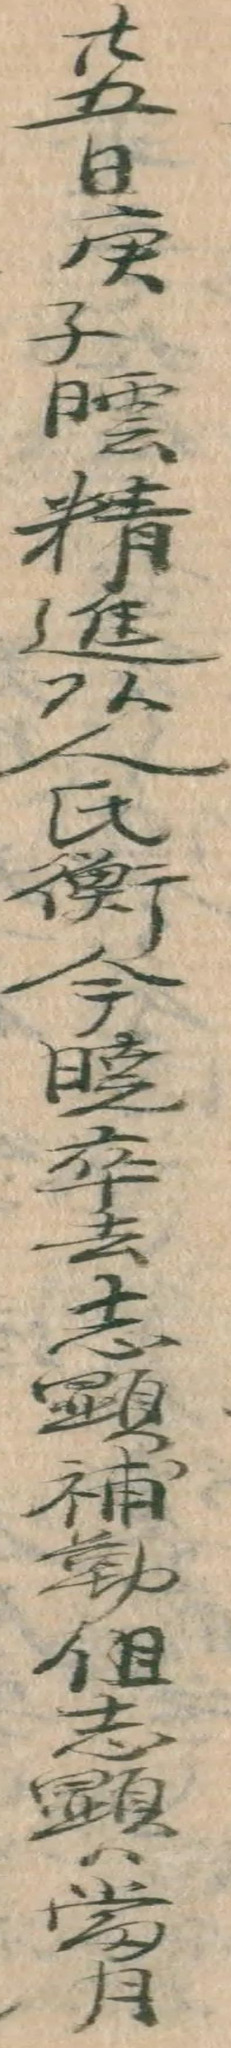廿五日庚子曇精進頭人氏衡今暁卒去志顕補勤但志顕ハ當月
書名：賀茂社記録. 第65冊
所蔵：国立国会図書館 National Diet Library, JAPAN
